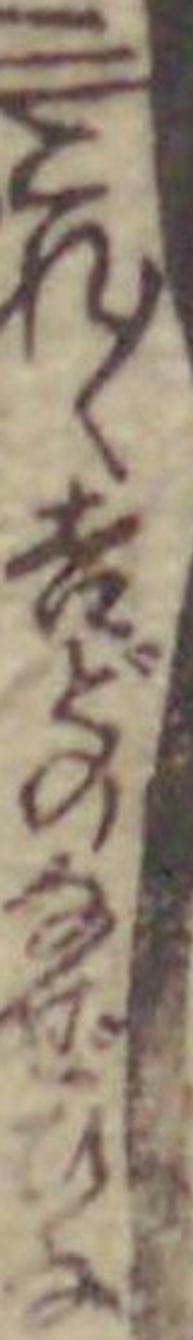これ〳〵吉どのなぜひな
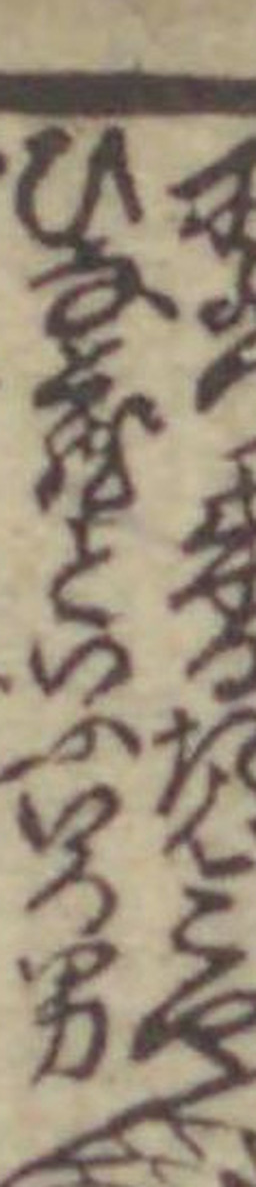ひな蔵といふいろ男
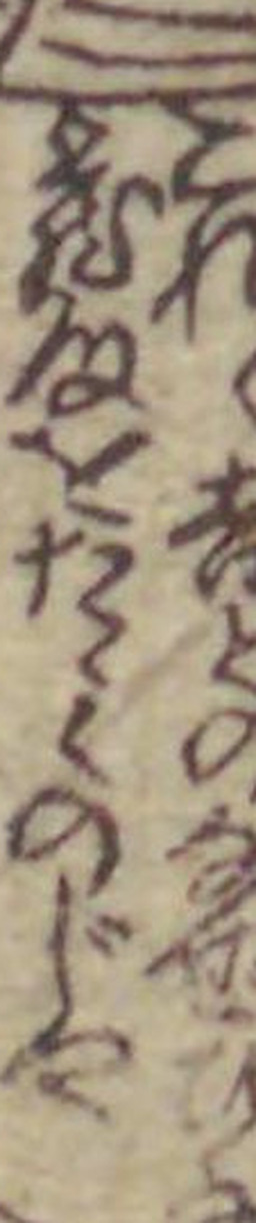蔵殿をたゝくのじや
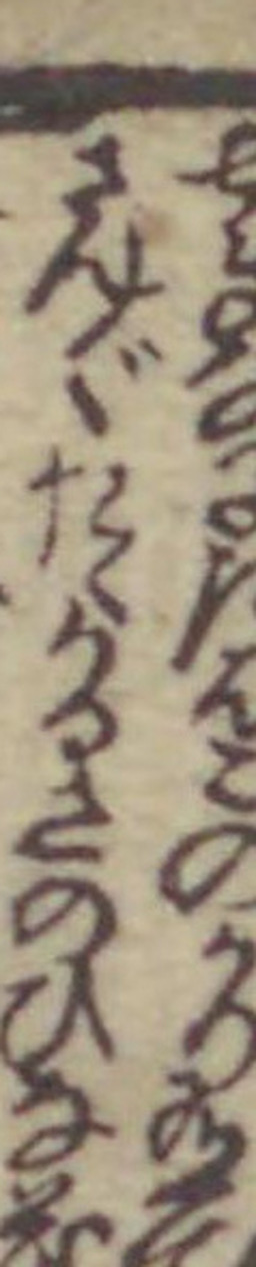さん〴〵たゝかるさのひな蔵に
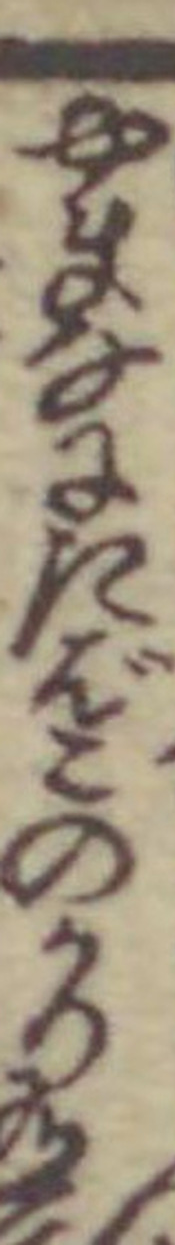やまなにたばこのかり有て
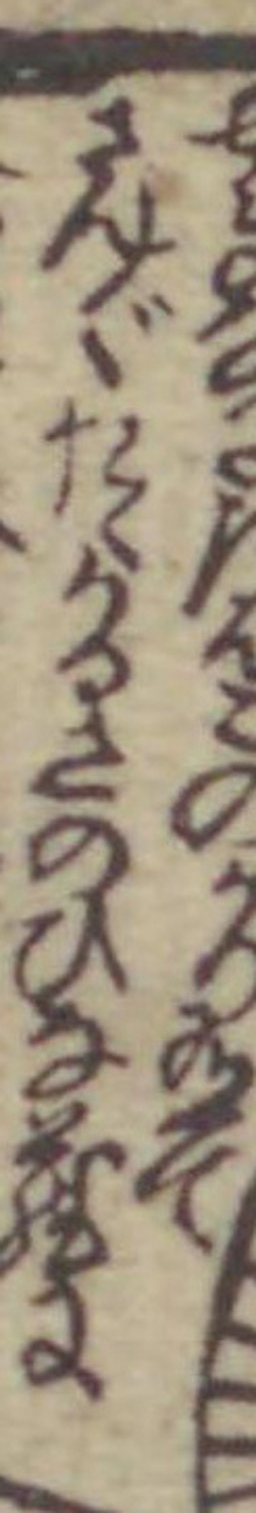さん〴〵たゝかるさのひな蔵に
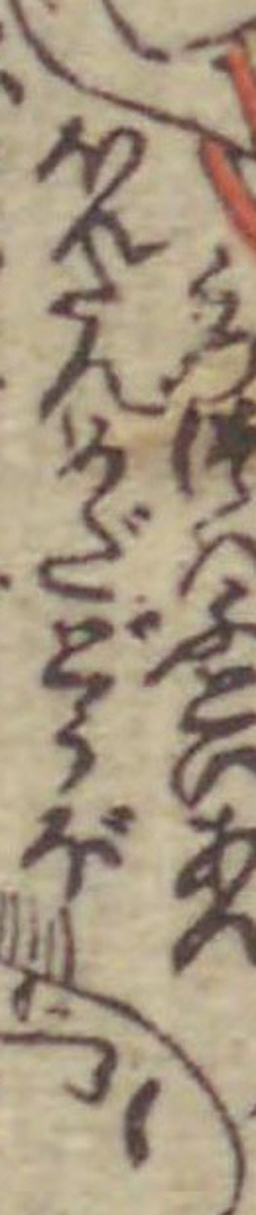ほんたんめだどうぼ
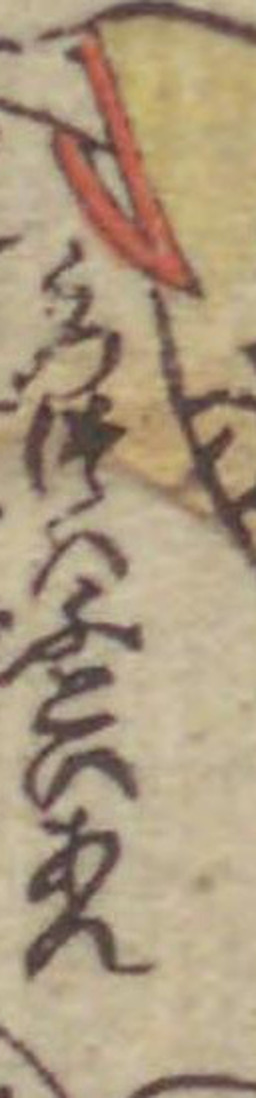こいつはふといあん
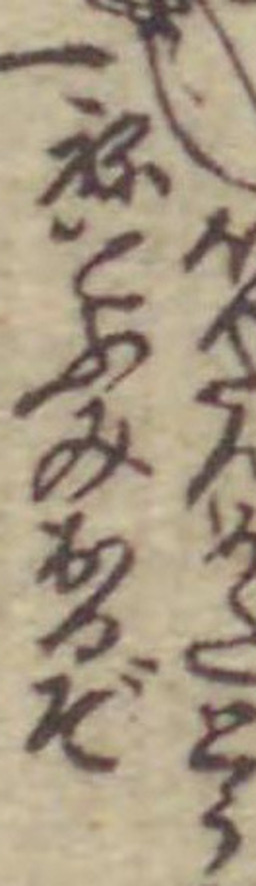ねをふみおるぞ
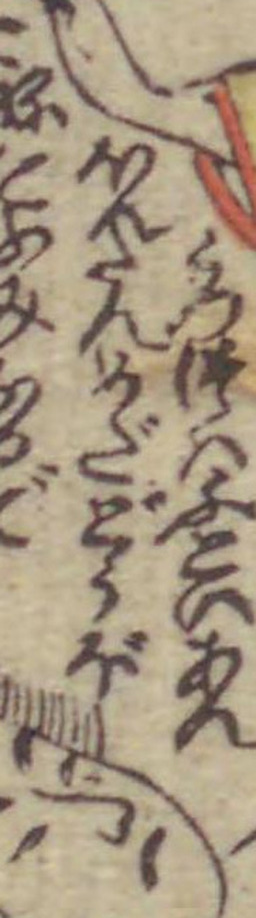ほんたんめだどうぼ
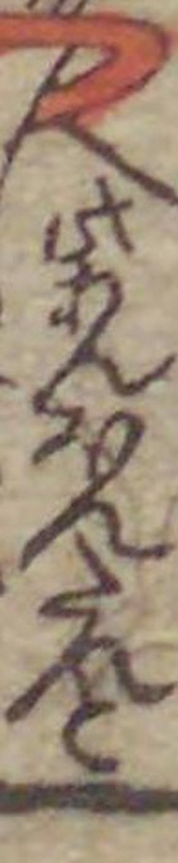此あんほんたんと
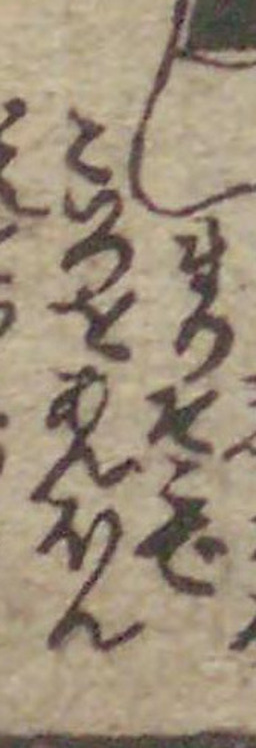こいつをあんほん
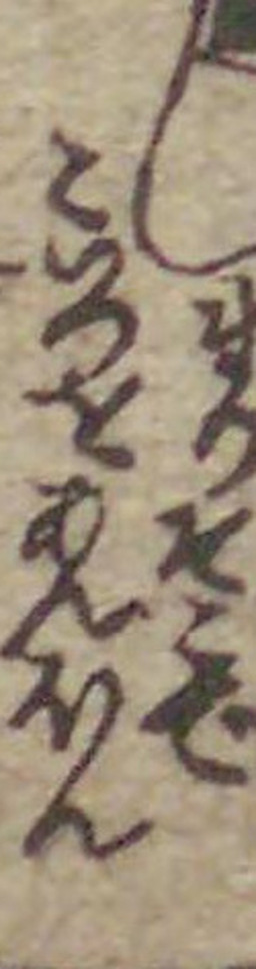こいつをあんほん
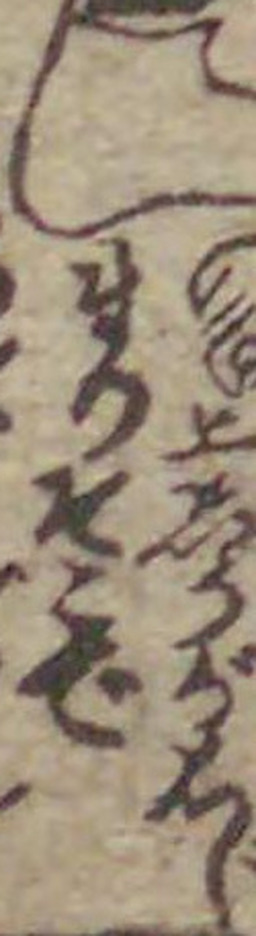まりそこで
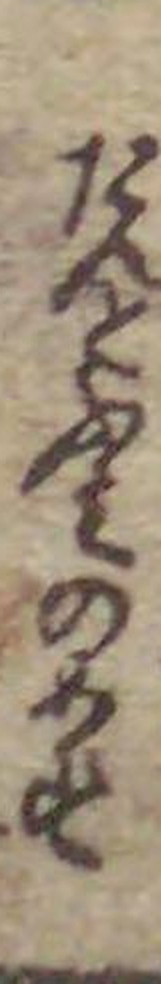たんとふみのめす

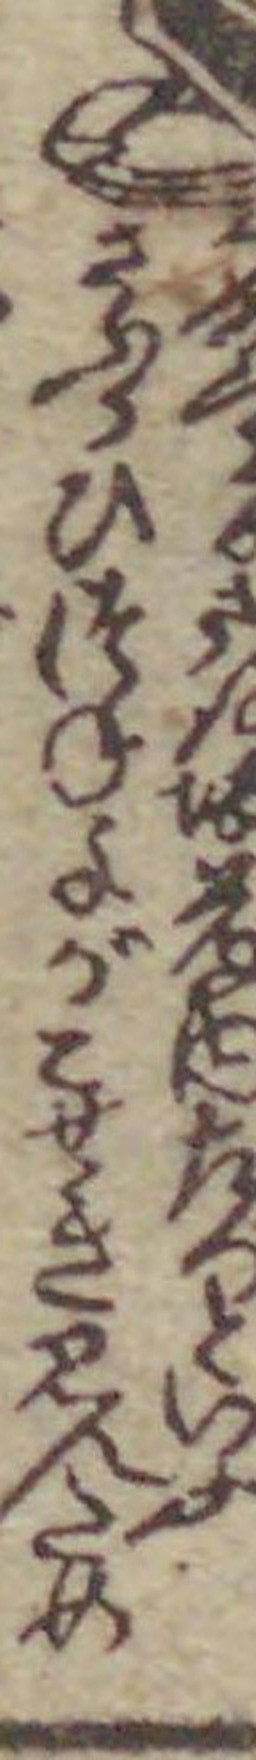さふらひつねよがこせき見んため
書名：娜二代鉢木 5巻
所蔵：国立国会図書館 National Diet Library, JAPAN
